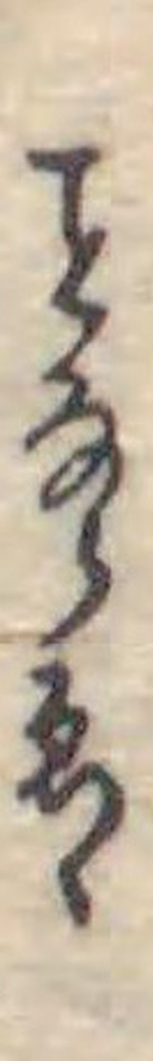ことならゑゝ
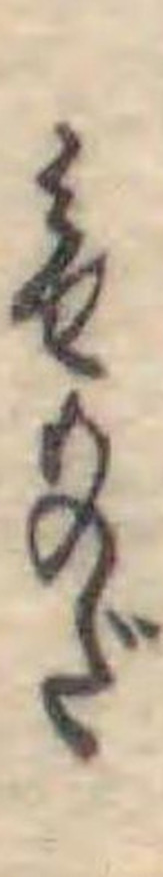みせものだ

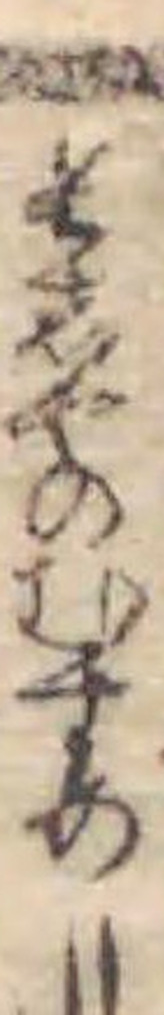長しやのむすめ
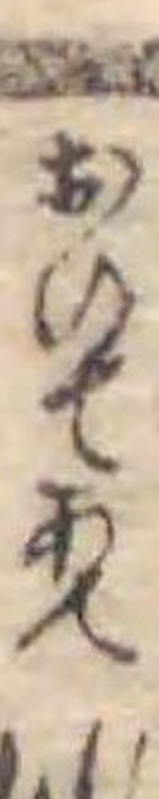おひてあん
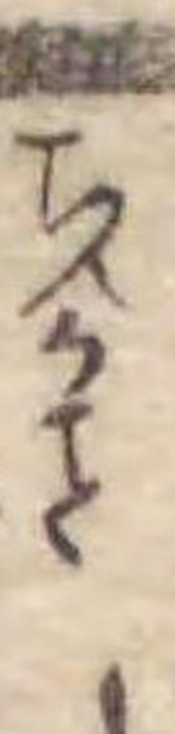ちんかこと
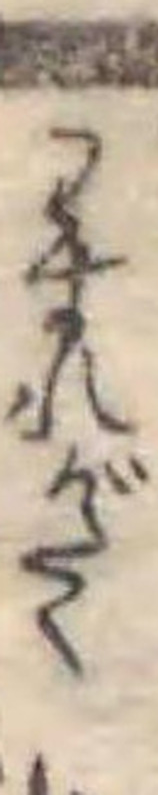わすれがたく
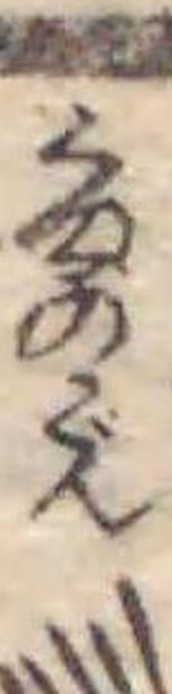くまのごん
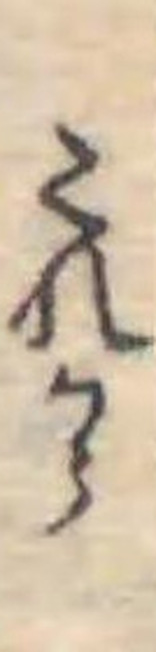これから
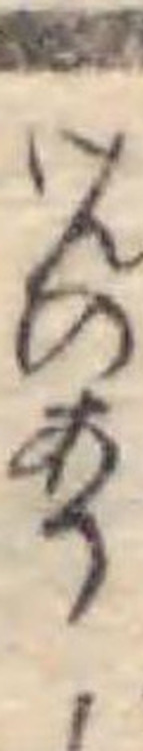けんのあり
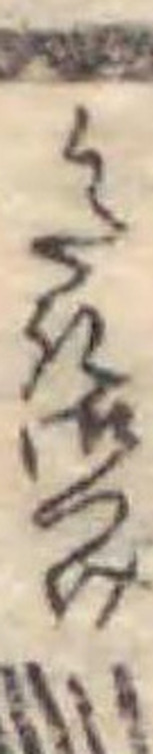かたき御つげ
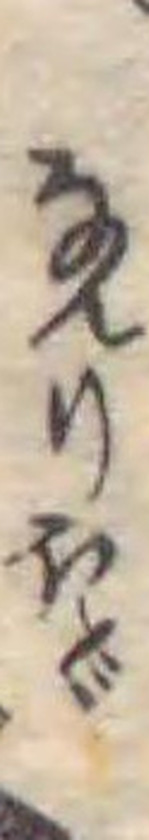なんりほど
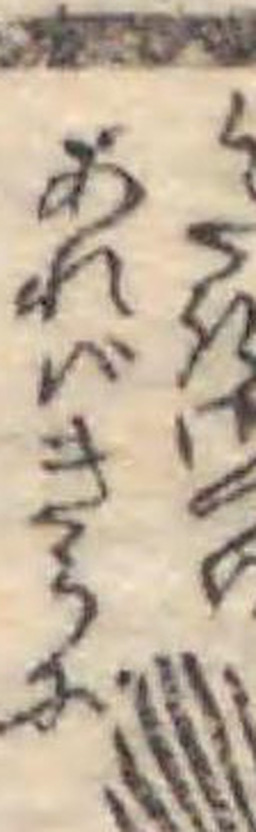あればきうに
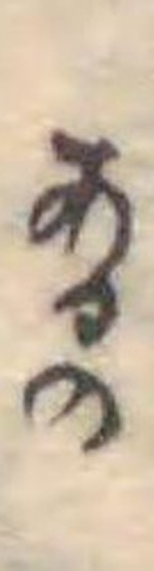あるの
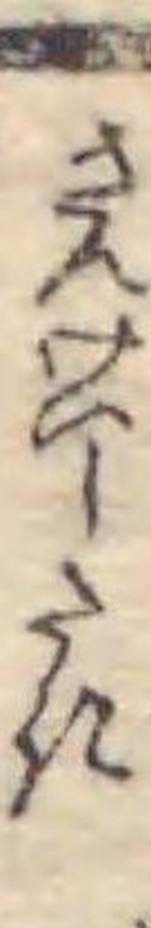さんけいしたき
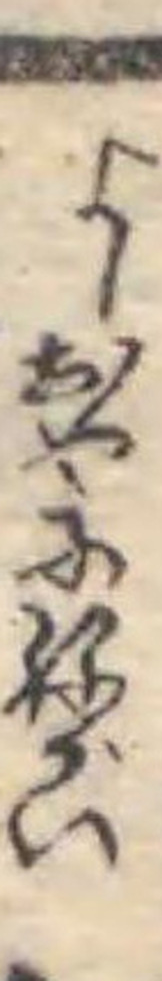よしおやにねがい
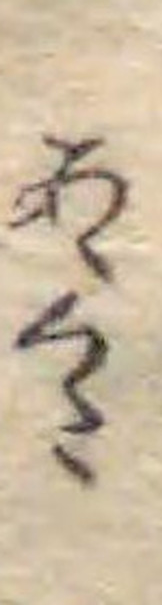あゝくた
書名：鐘入七人化粧 : 3巻
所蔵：国立国会図書館 National Diet Library, JAPAN
